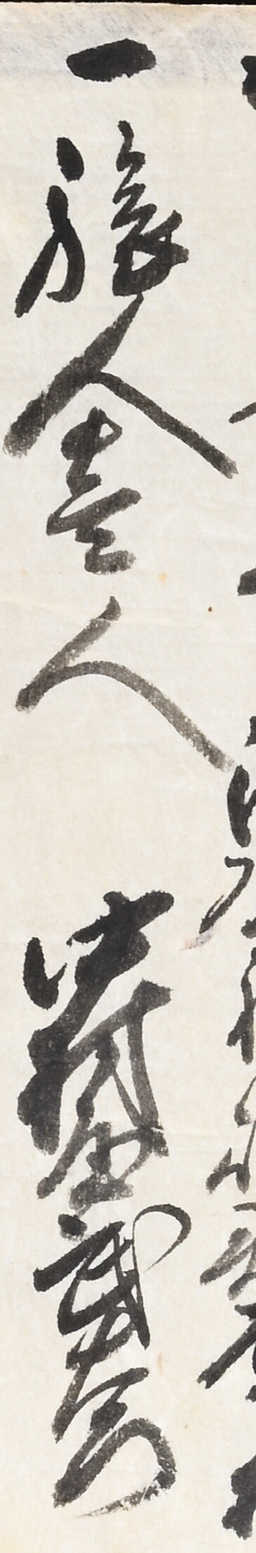一旅人壱人中村屋武右衛門
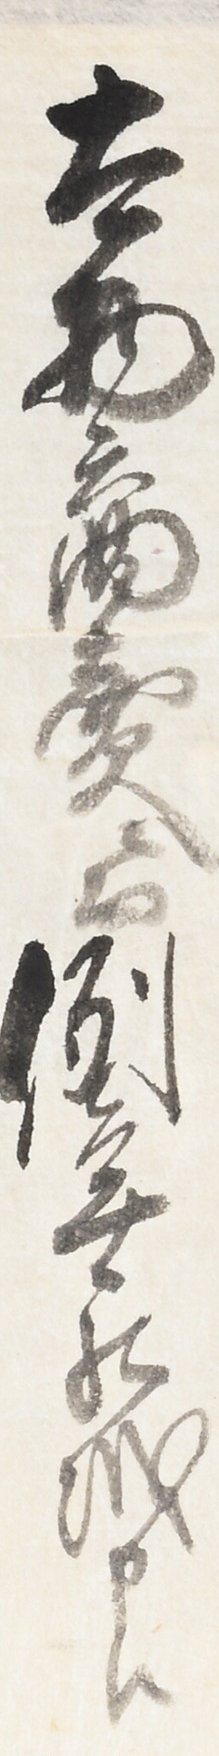太物商売ニ而例年罷越申候
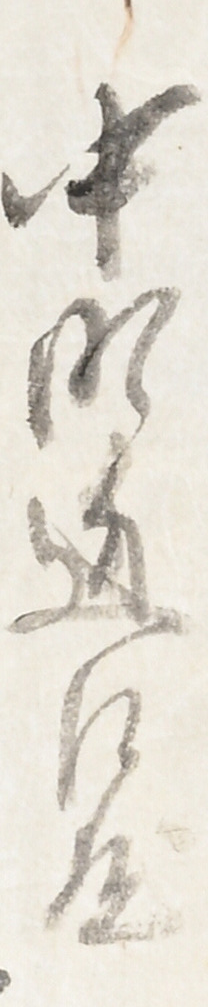中町近江屋
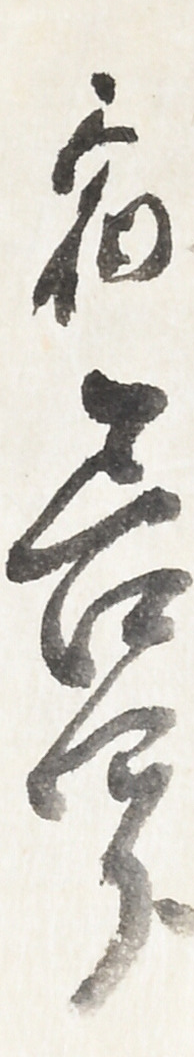宿善四郎
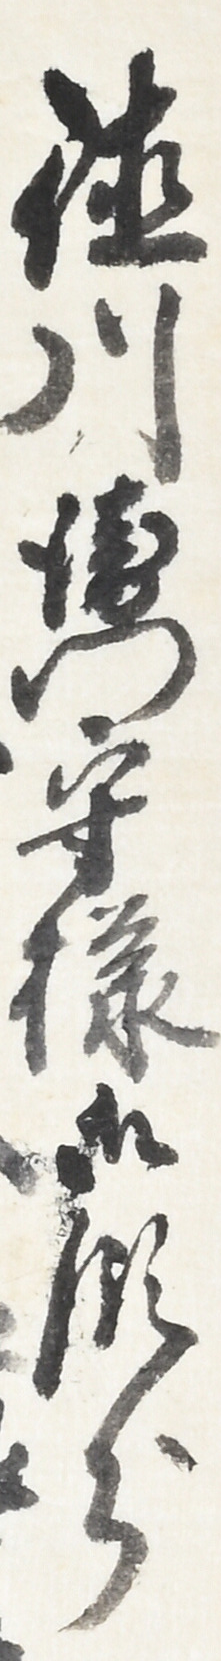徳川衛門守様御領分
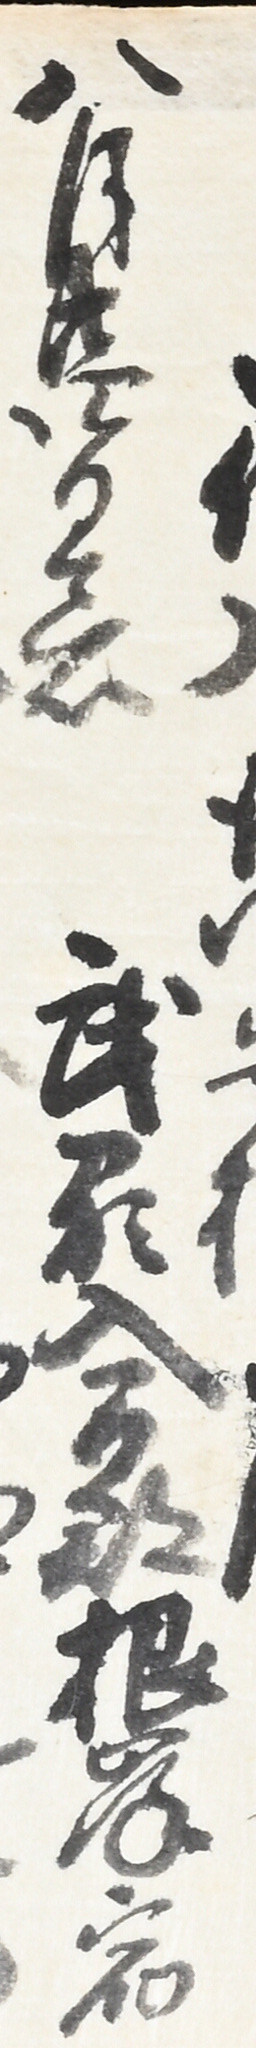八月廿四日着武州入間郡根岸宿
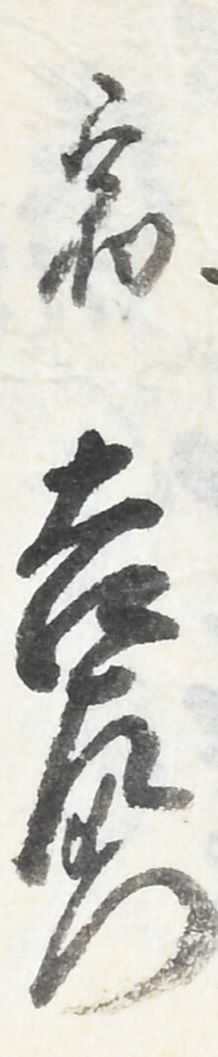宿常右衛門
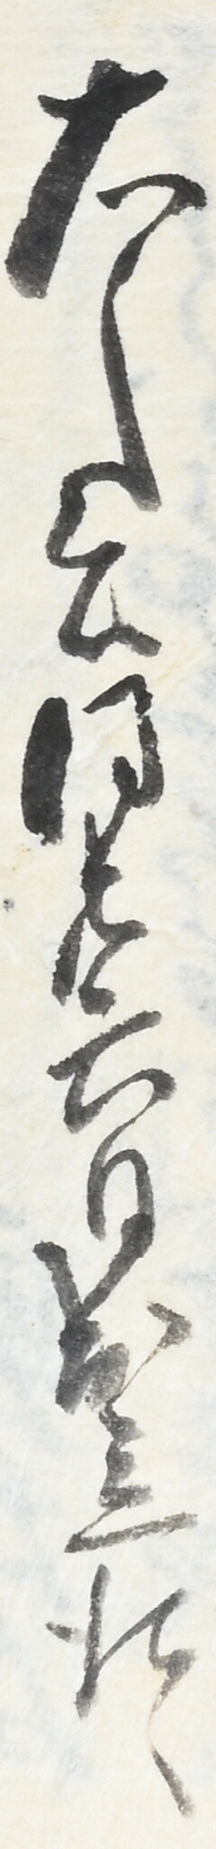右之者同廿九日出立仕候

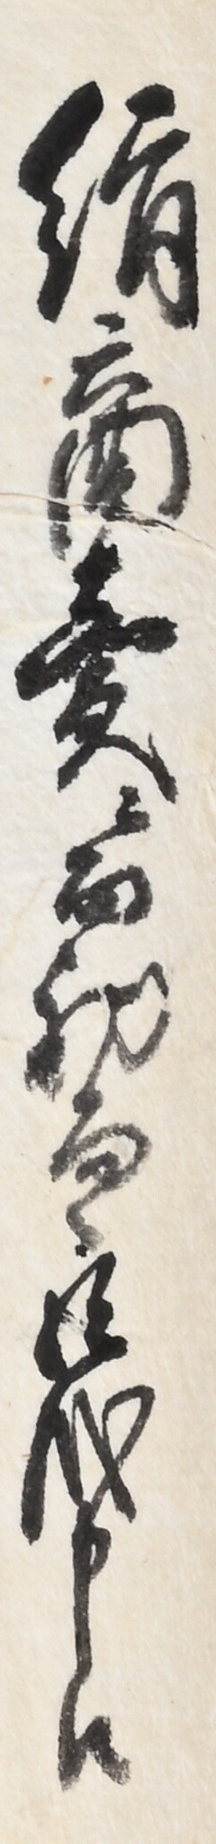絹商売ニ而初而罷越申候
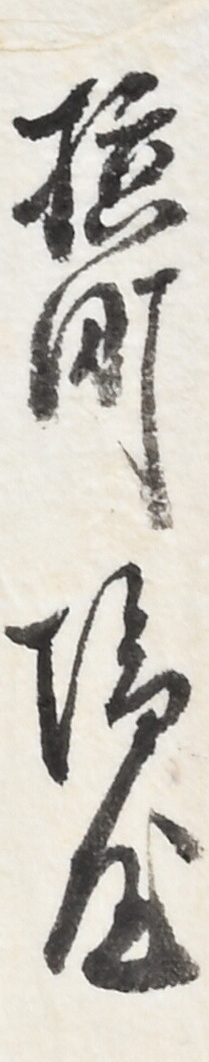横町塩屋
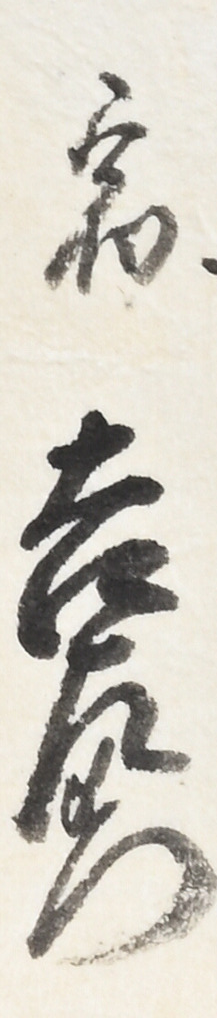宿吉左衛門
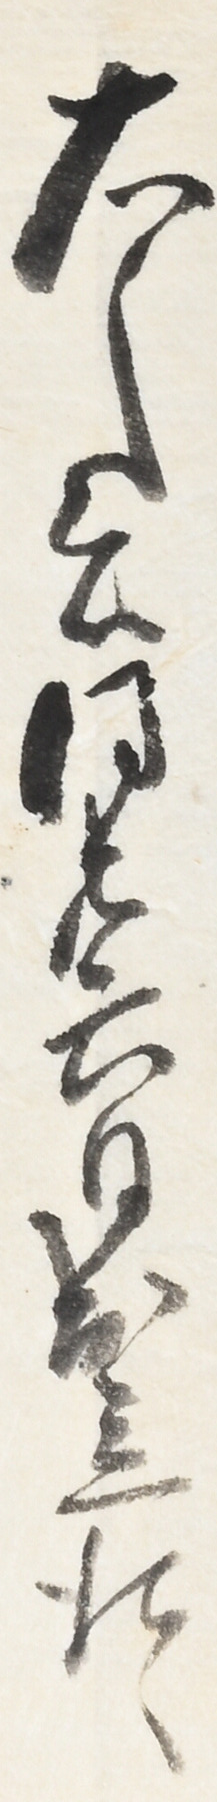右之者同廿六日出立仕候
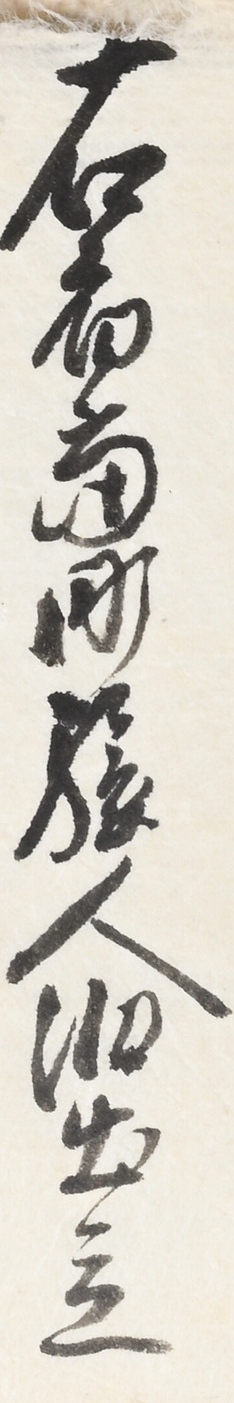右者当町旅人泊出立
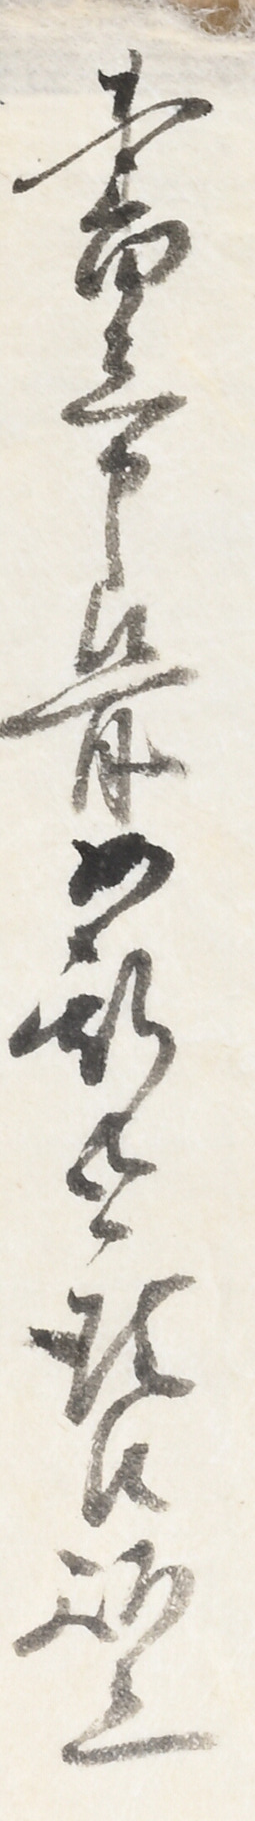書上申候所如斯御座候以上
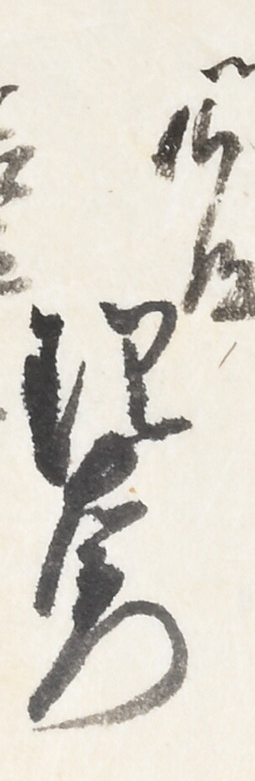理右衛門
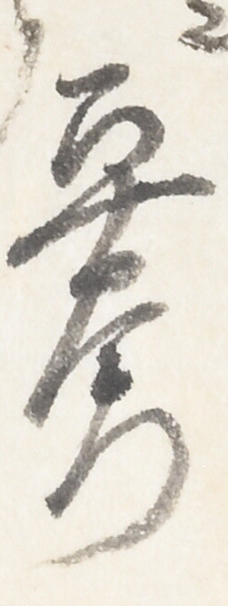理右衛門
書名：旅人泊控帳
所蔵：伊那市立高遠町図書館・合同会社AMANE
